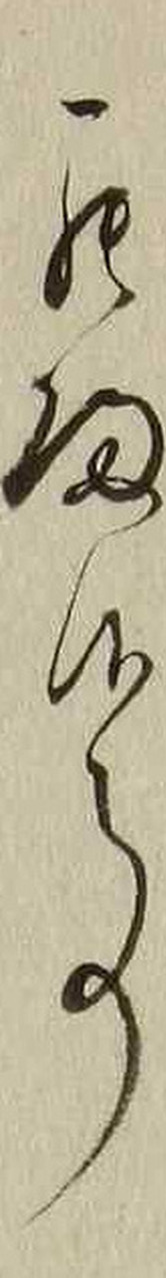罷帰候事
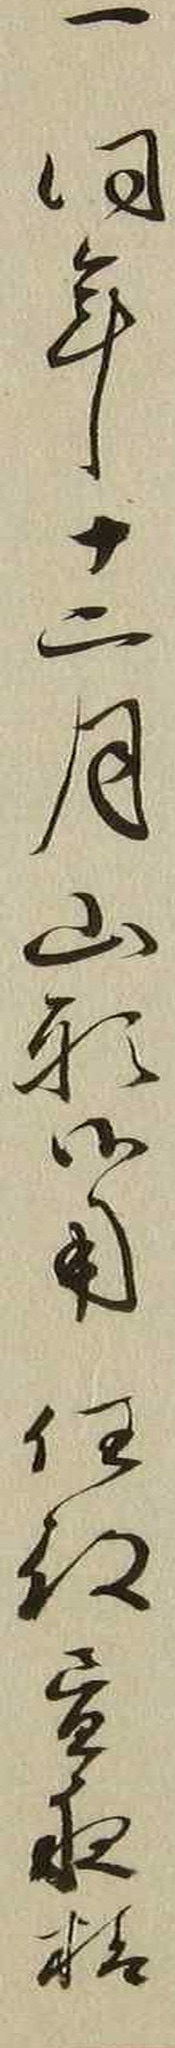一同年十二月山形御用任役昼夜精
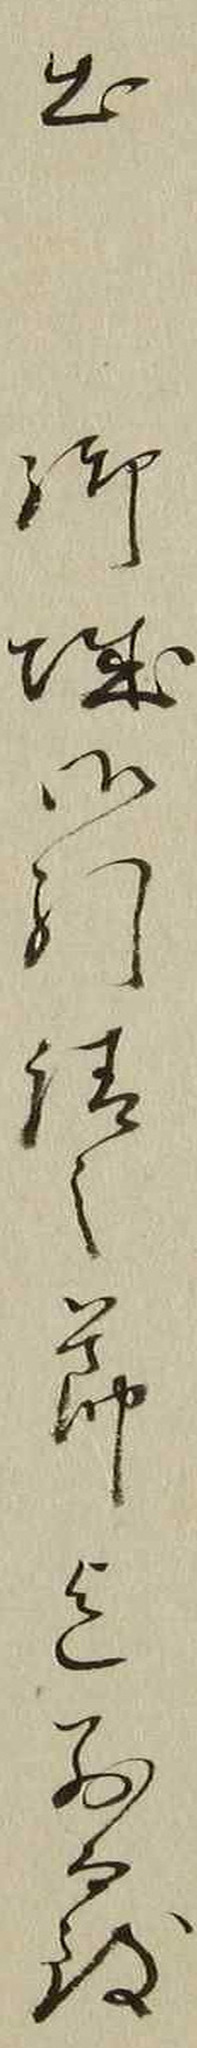出御城御引請之節迄別而致
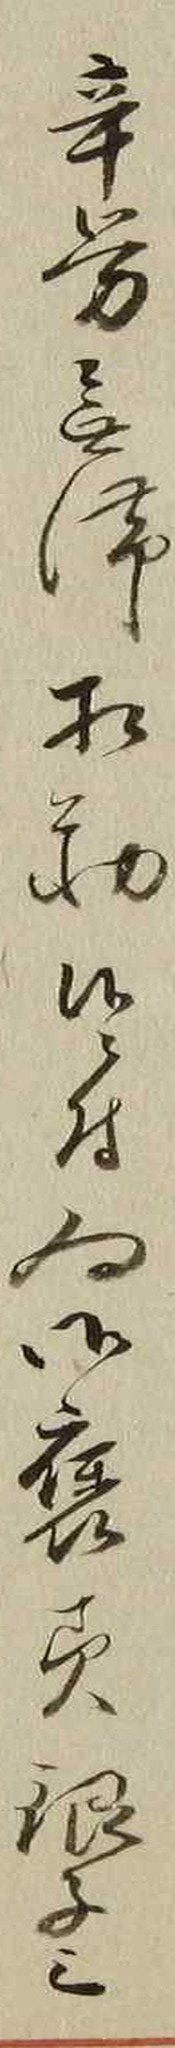辛労無滞相勤候ニ付為御褒美銀子三
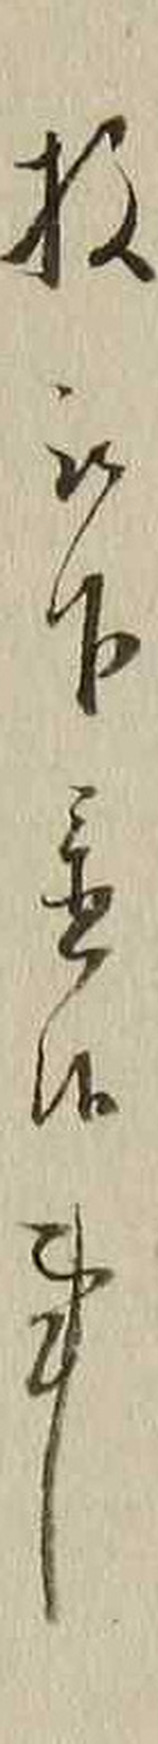枚被下置候事
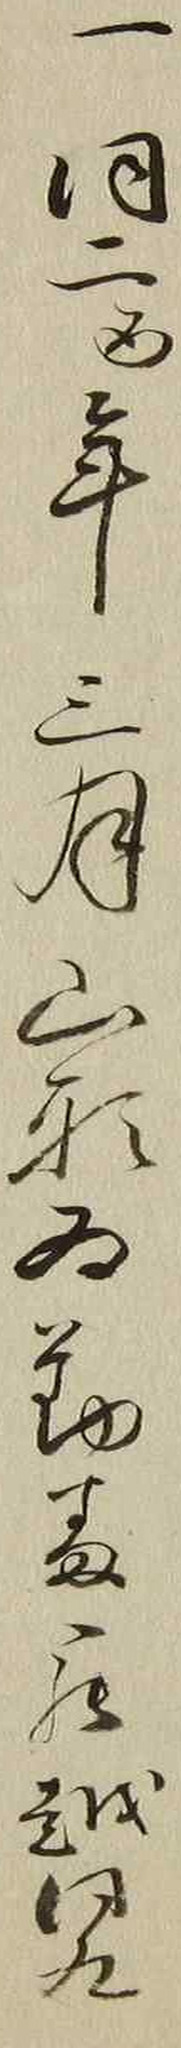一同二酉年三月山形為勤番罷越同九
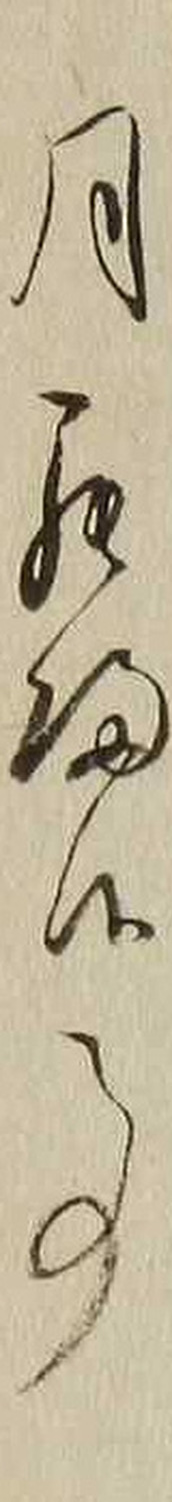月罷帰候事
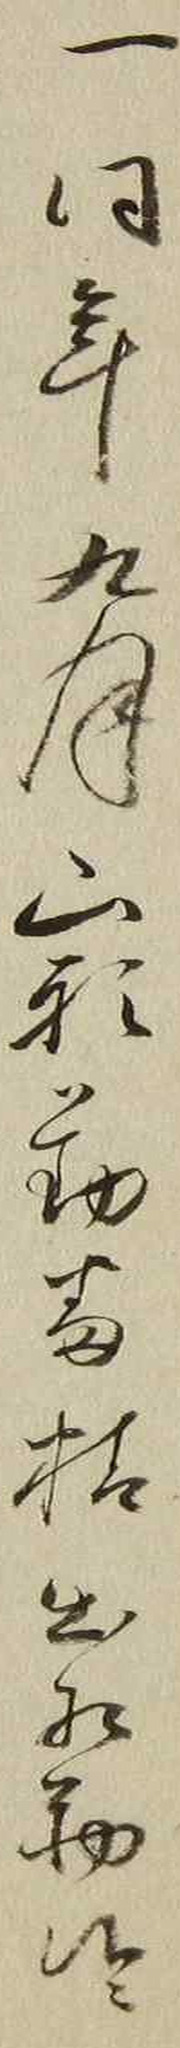一同年九月山形勤番精出相勤候ニ
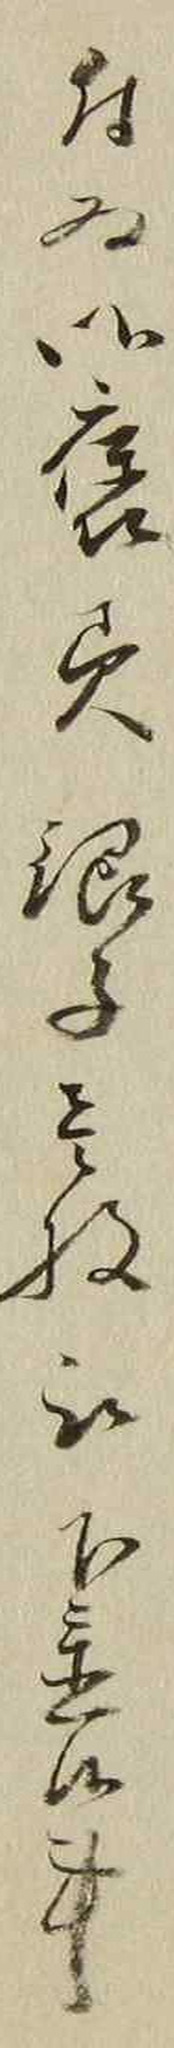付為御褒美銀子壱枚被下置候事
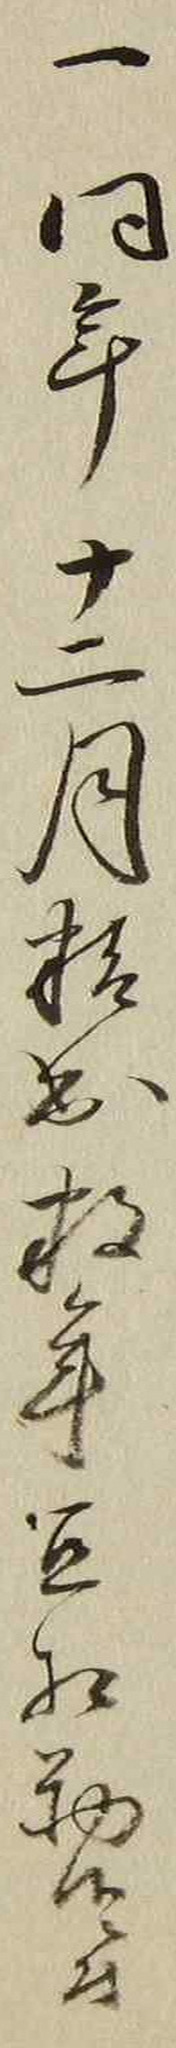一同年十二月精出枚年宜相勤候ニ付
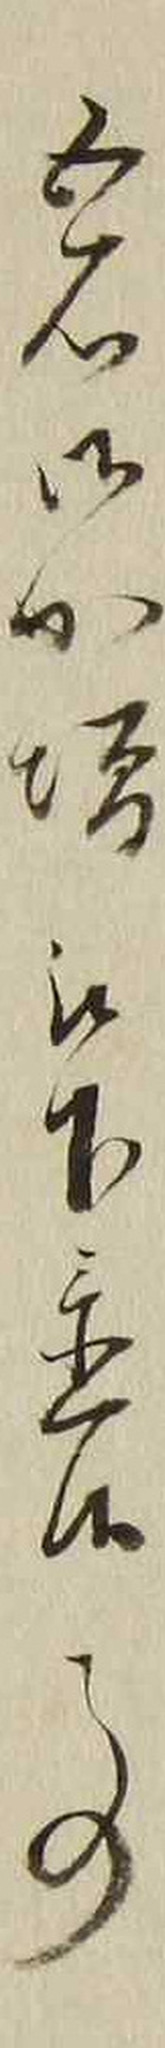五石御加増被下置候事
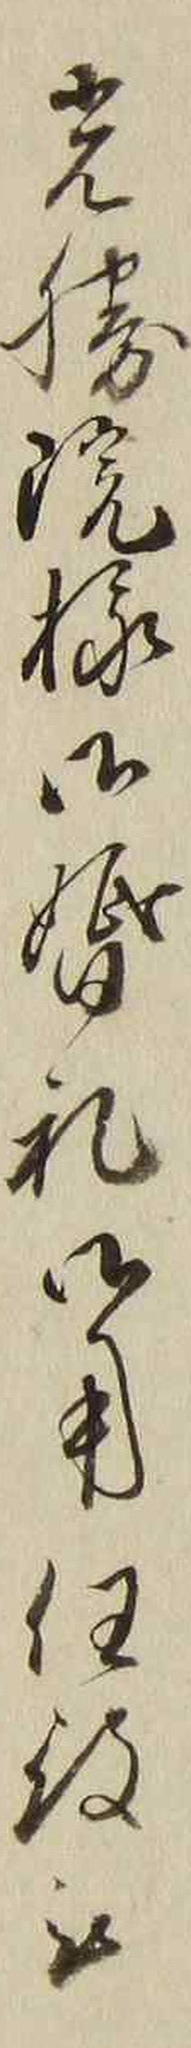光勝院様御婚礼御用任役被

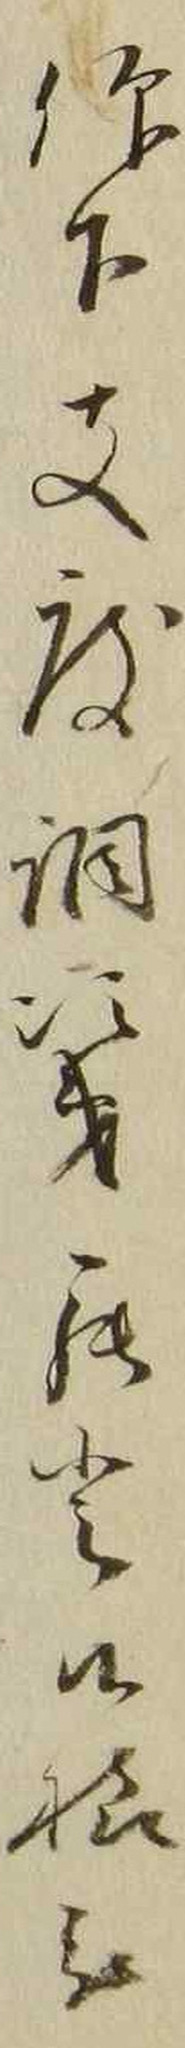仰下支度調次第罷登御様被
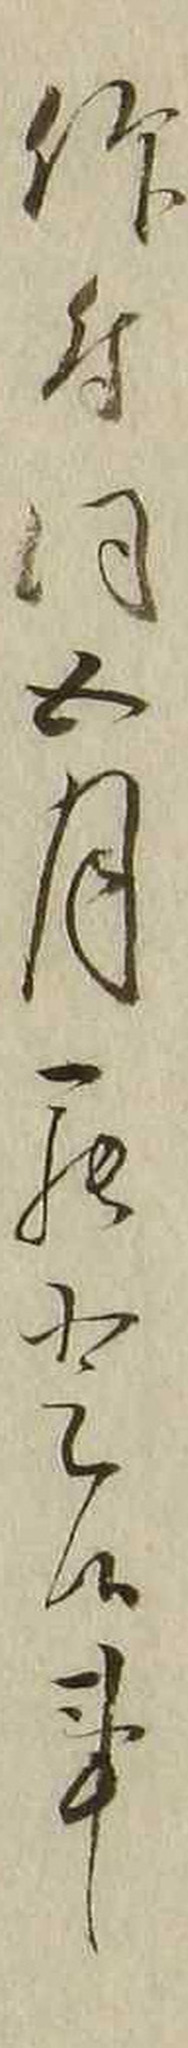仰付同五月罷登候事
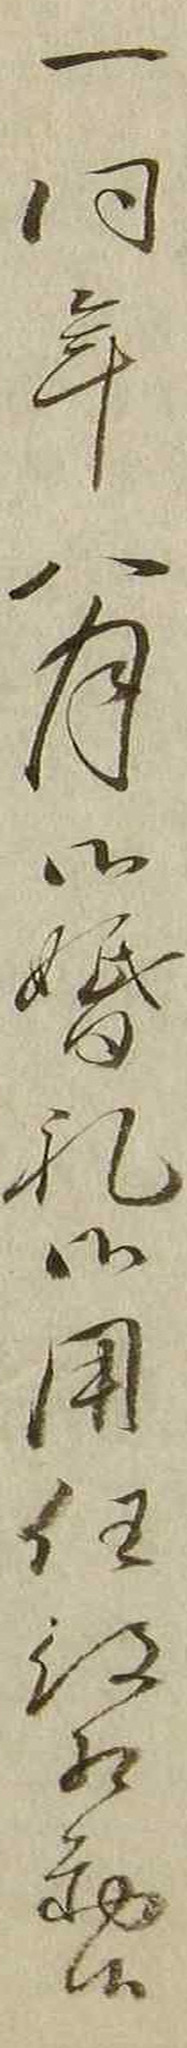一同年八月御婚礼御用任役相勤候
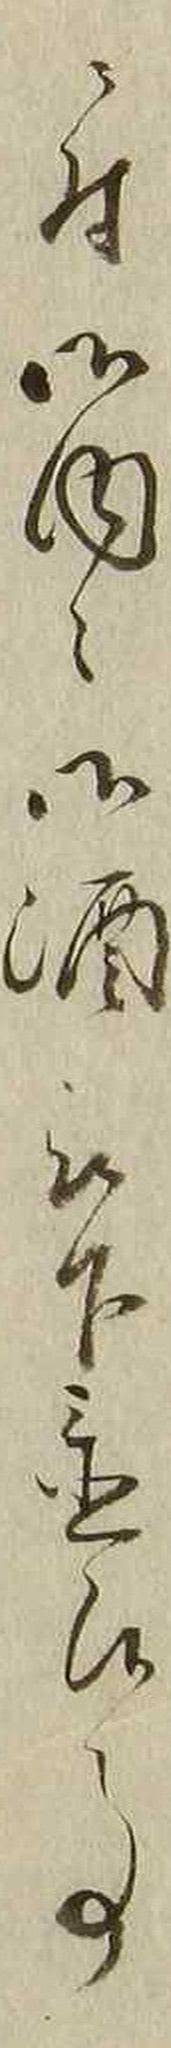ニ付御内々御酒被下置候事
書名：諸士系譜　巻之52　に之部3
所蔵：会津若松市立会津図書館
